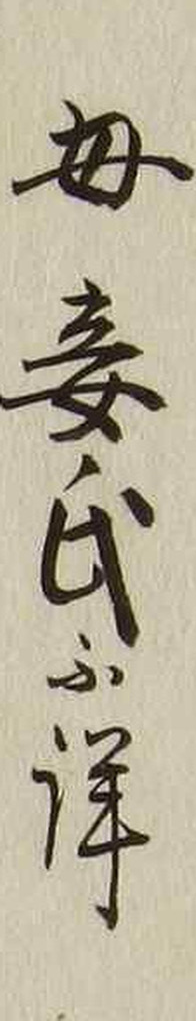母妾氏不詳
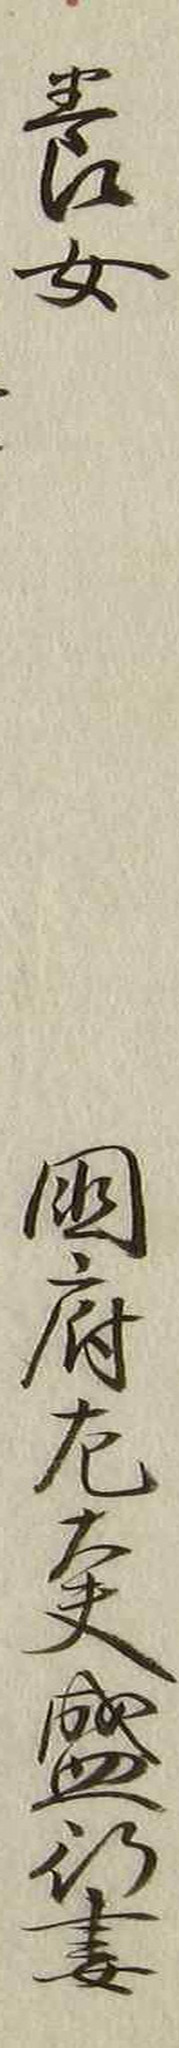養女国府左大夫盛行妻
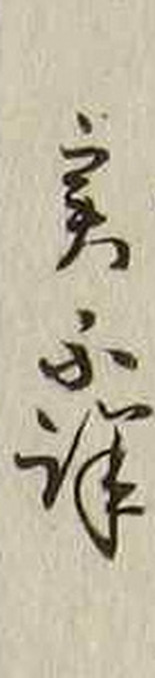実不詳
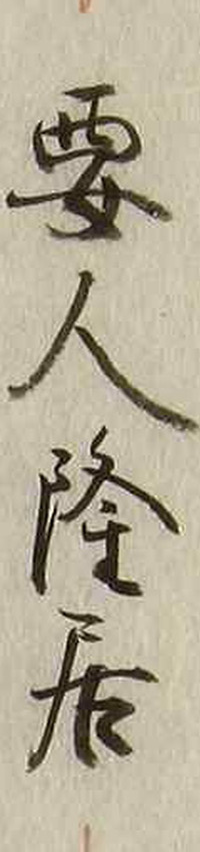要人隆居
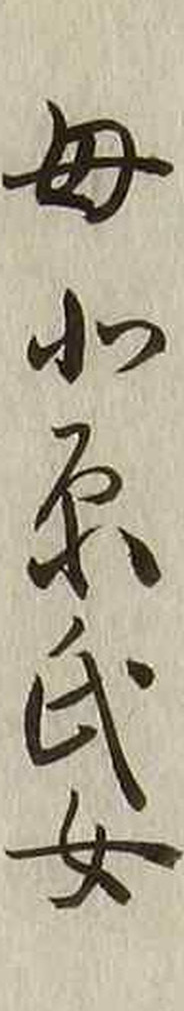母北原氏女
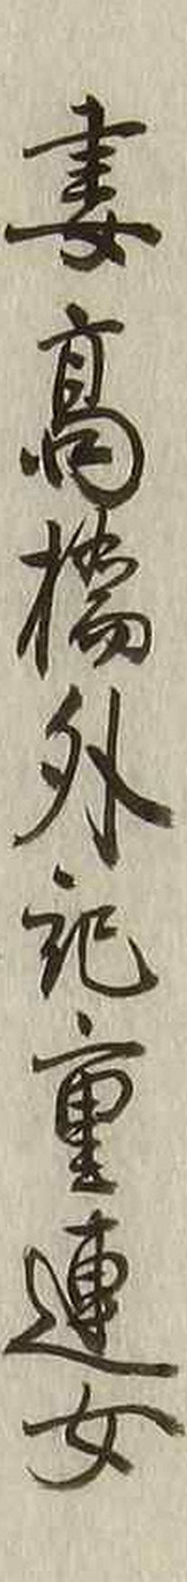妻高橋外記重連女
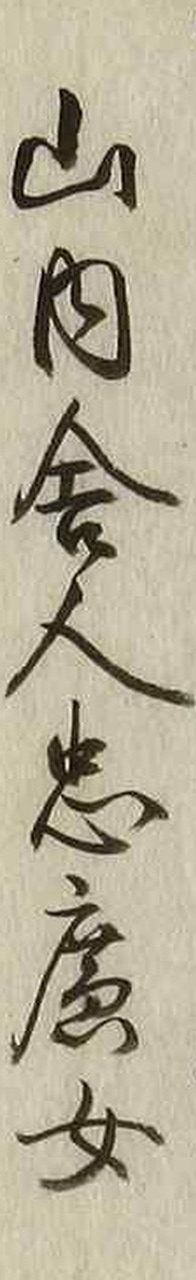山内舎人忠広女
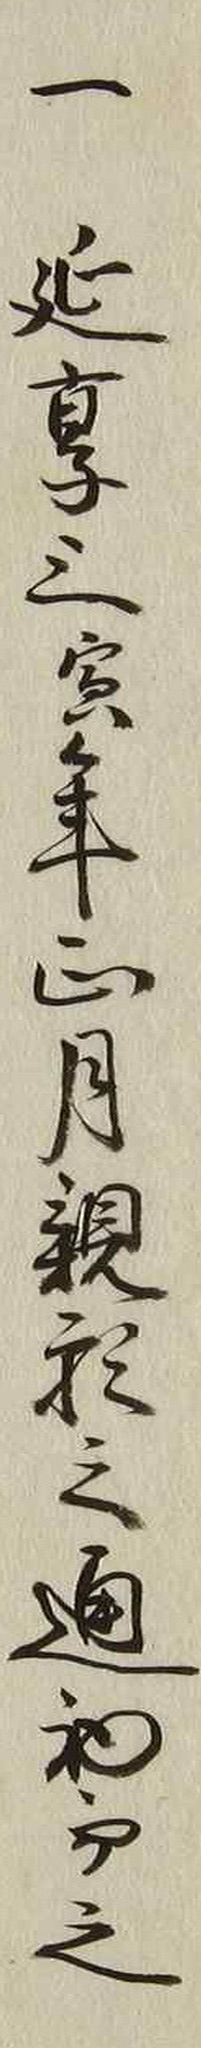一延享三寅年正月親願之通初而之
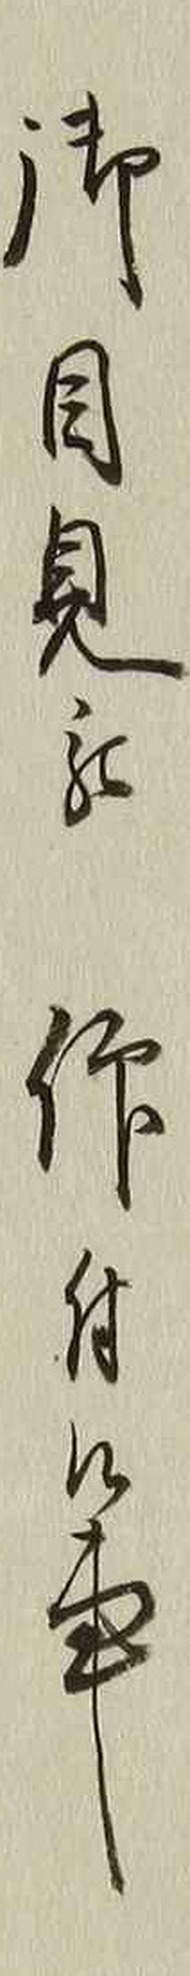御目見被仰付候事
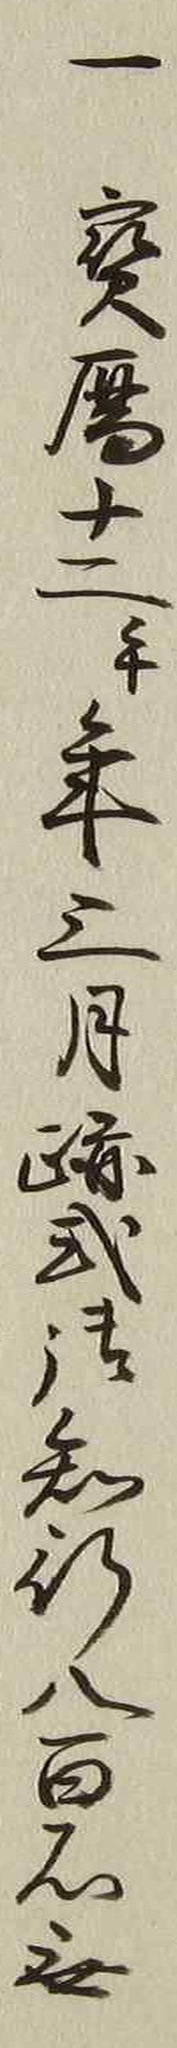一宝暦十二午年三月跡式御知行八百石無
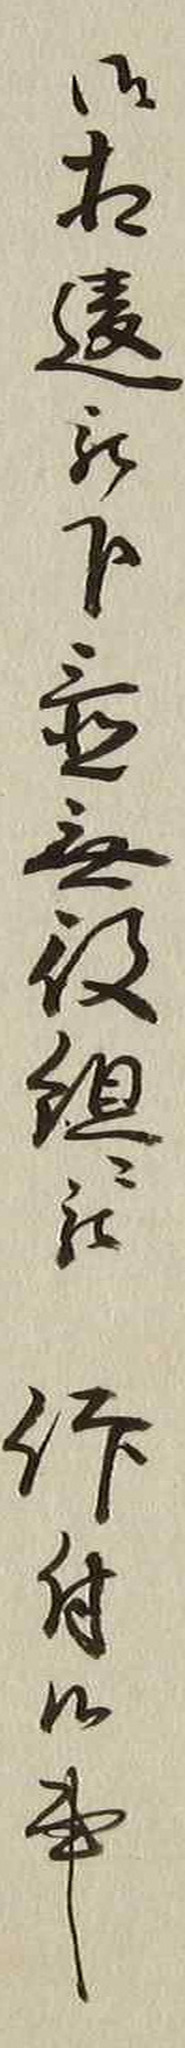御相違被下置無役組ニ被仰付候事
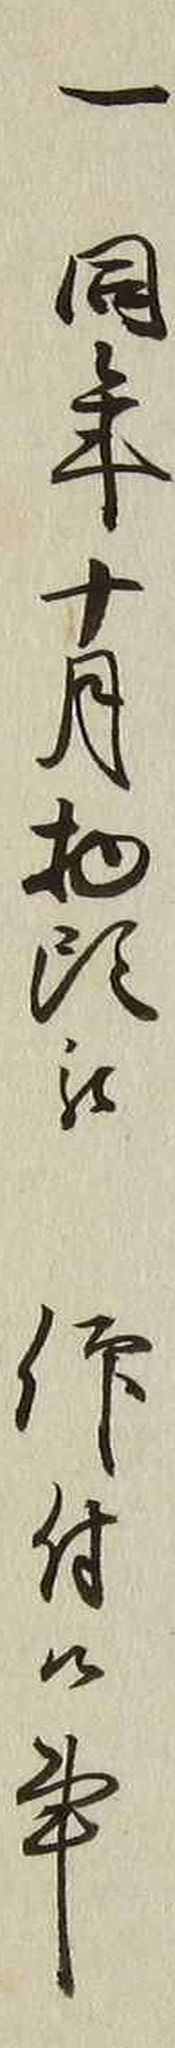一同年十月物頭被仰付候事
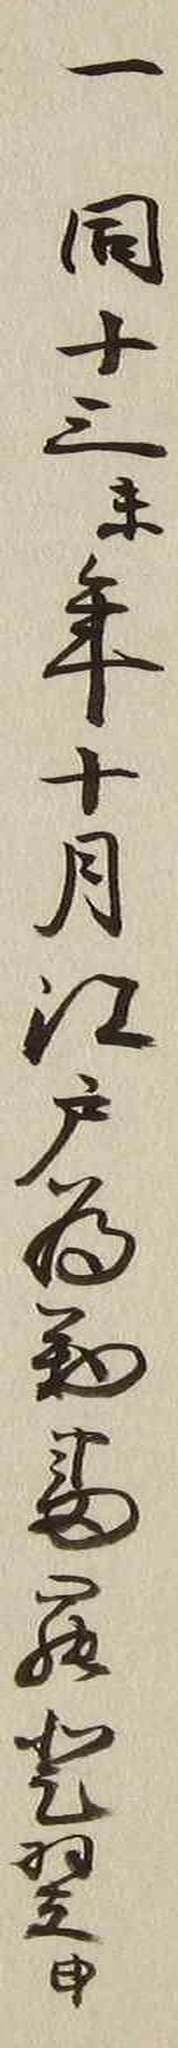一同十三未年十月江戸為勤番罷登翌申
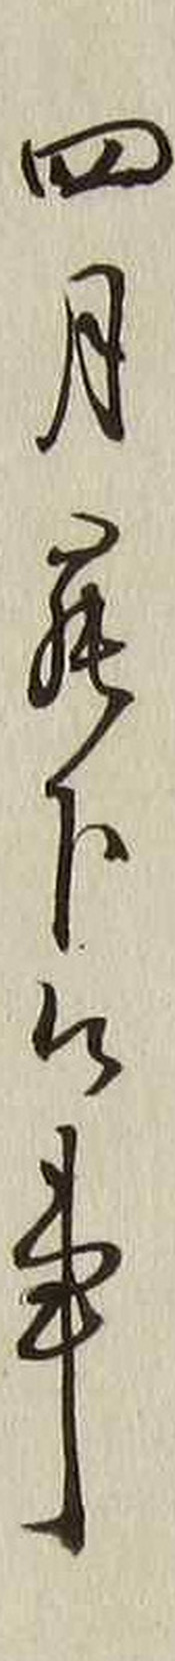四月罷下候事
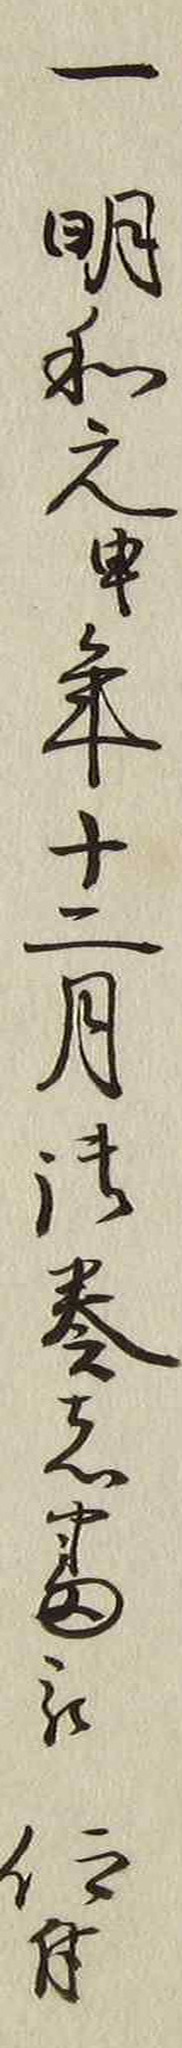一明和元申年十二月御奏者番被仰付
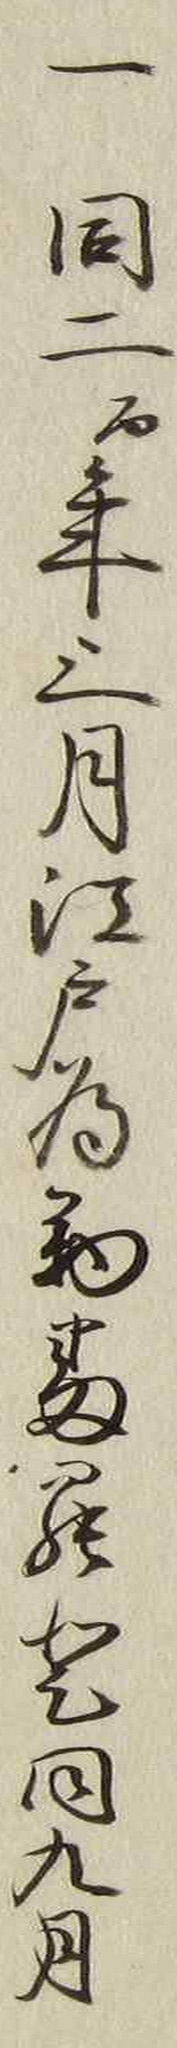一同二酉年三月江戸為勤番罷登同九月
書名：諸士系譜　巻之15　い之部15
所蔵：会津若松市立会津図書館
